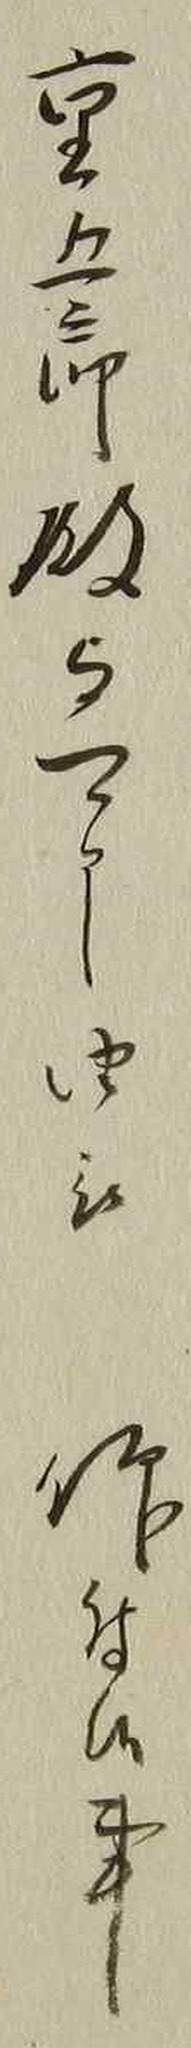重五郎殿与可申由被仰付候事
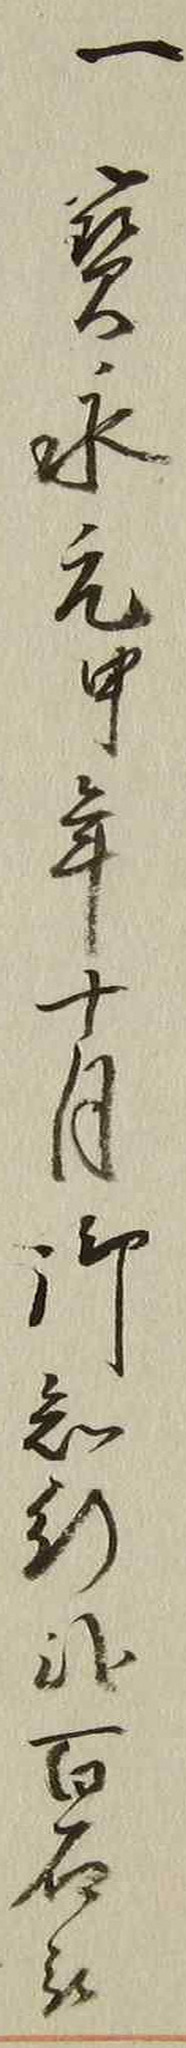一宝永元申年十月御知行弐百石被
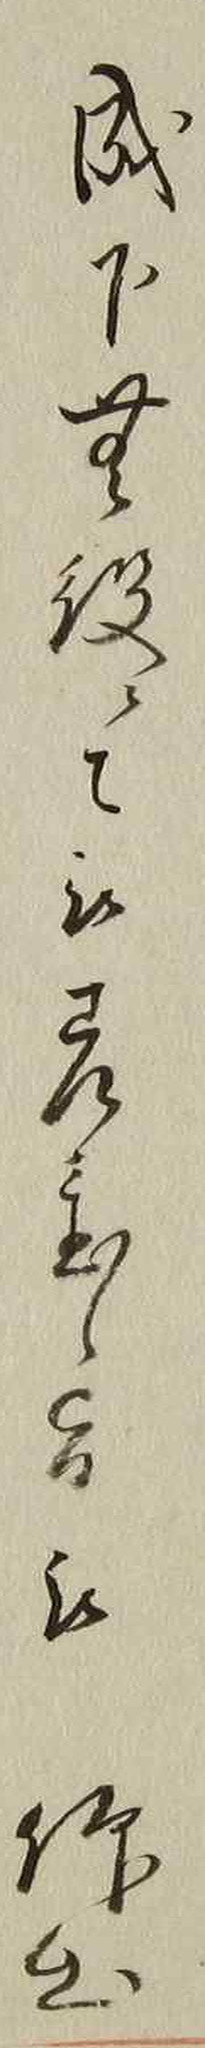成下無役ニて被差置候旨被仰出
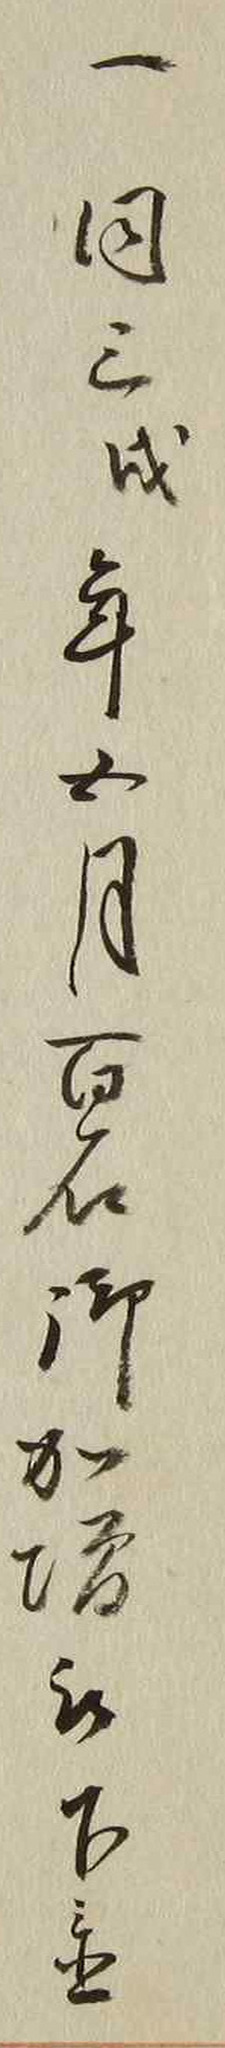一同三戌年五月百石御加増被下置
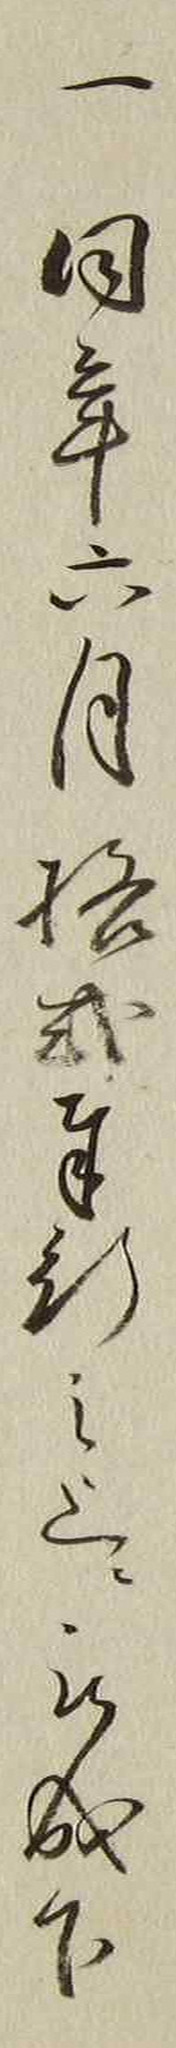一同年六月格式奉行之上ニ被成下
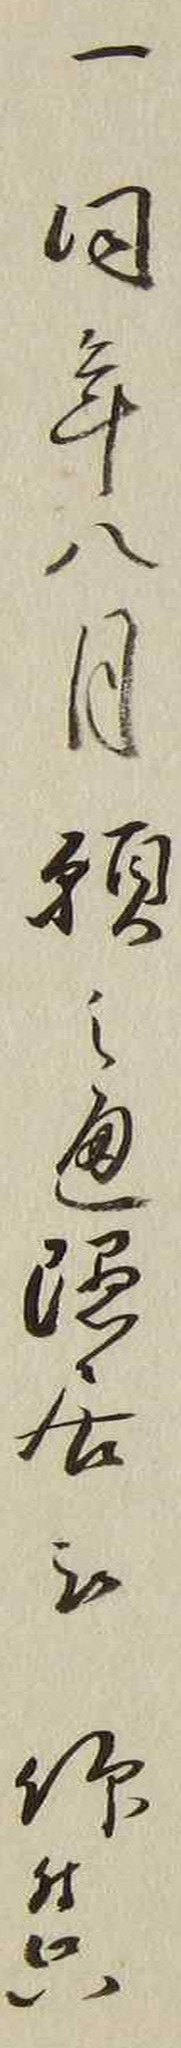一同年八月願之通隠居被仰付只
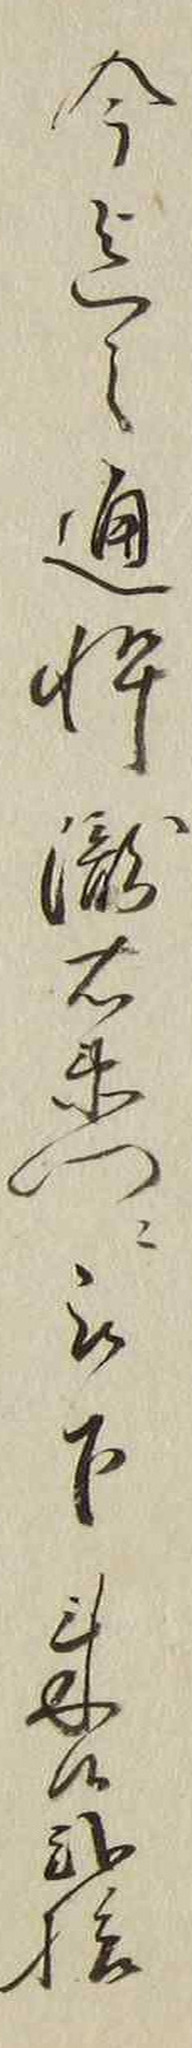今迄之通忰滝右衛門ニ被下置候弐拾
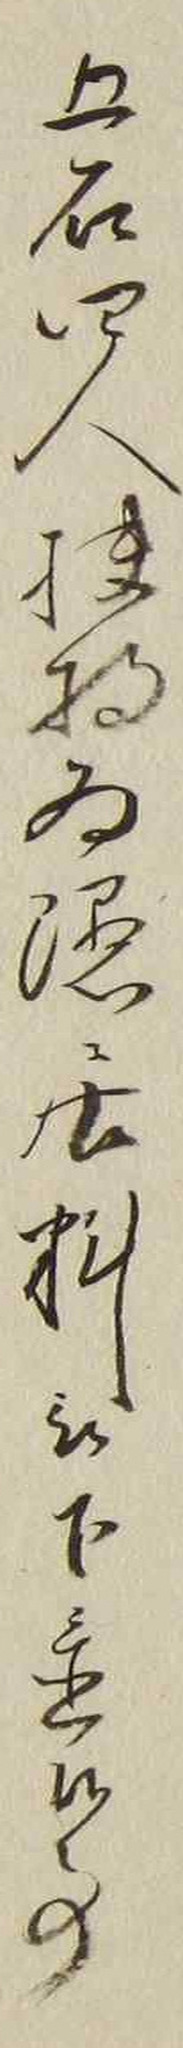五石四人扶持為隠居料被下置候事

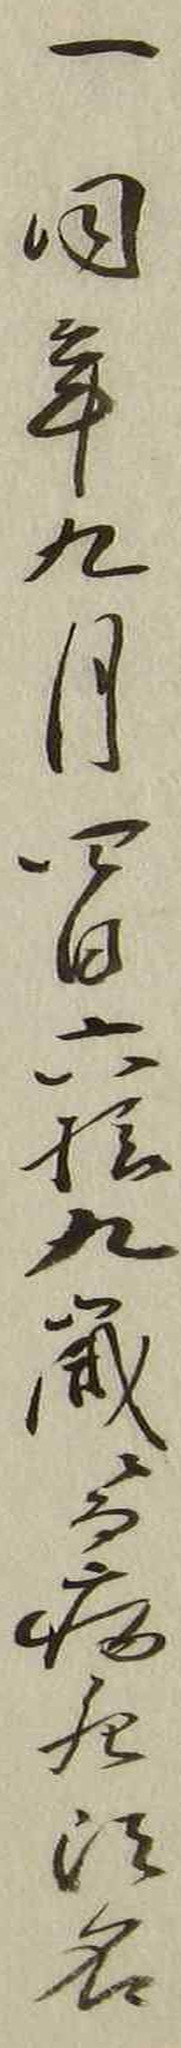一同年九月四日六拾九歳ニ而病死法名
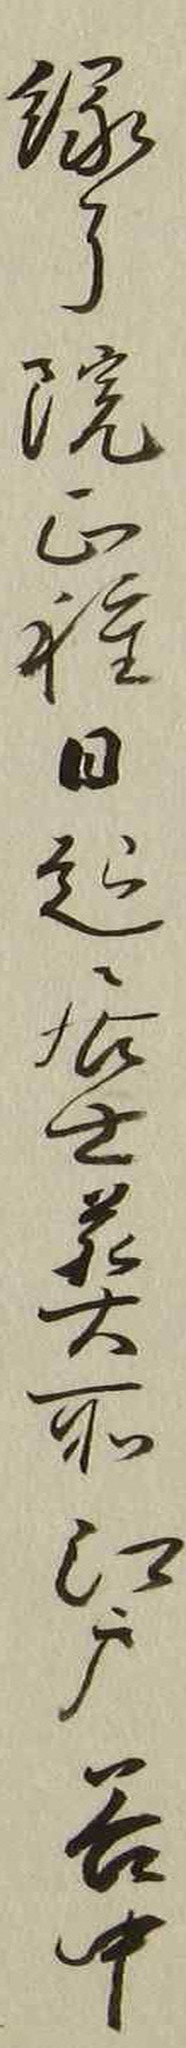縁了院正種日超居士葬所江戸谷中
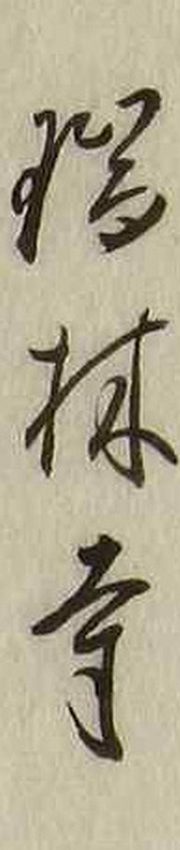瑞林寺
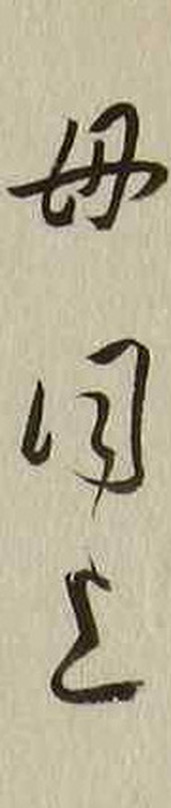母同上
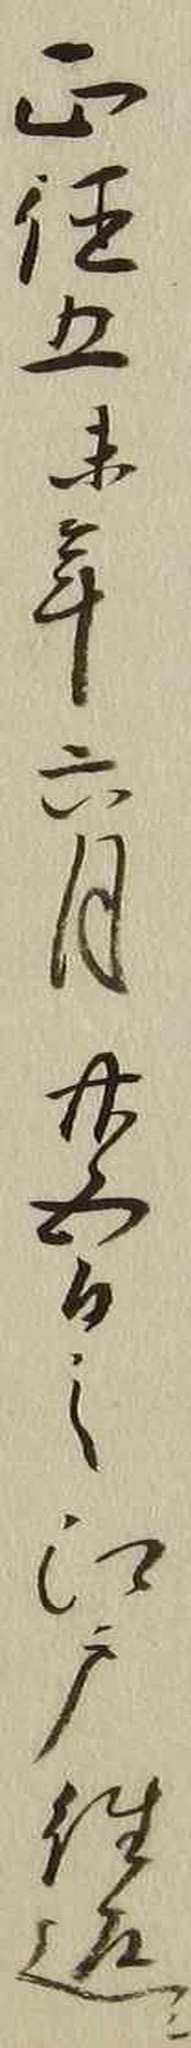正徳五未年六月廿五日之江戸往返ニ
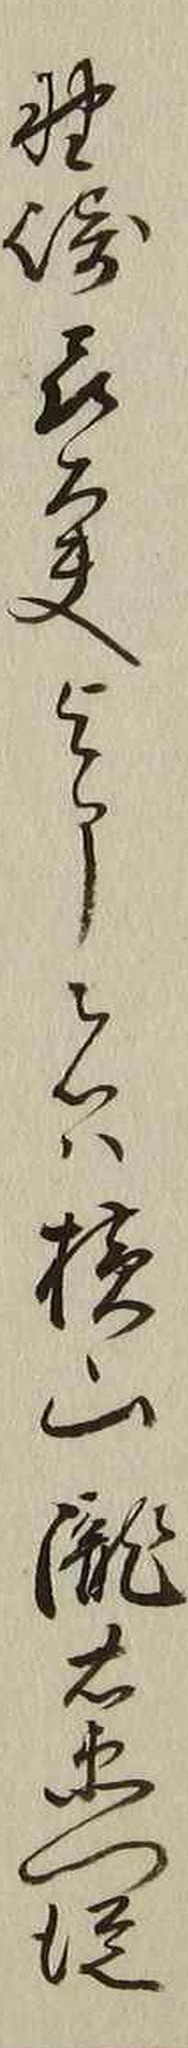野崎喜大夫与申者ハ横山滝右衛門従
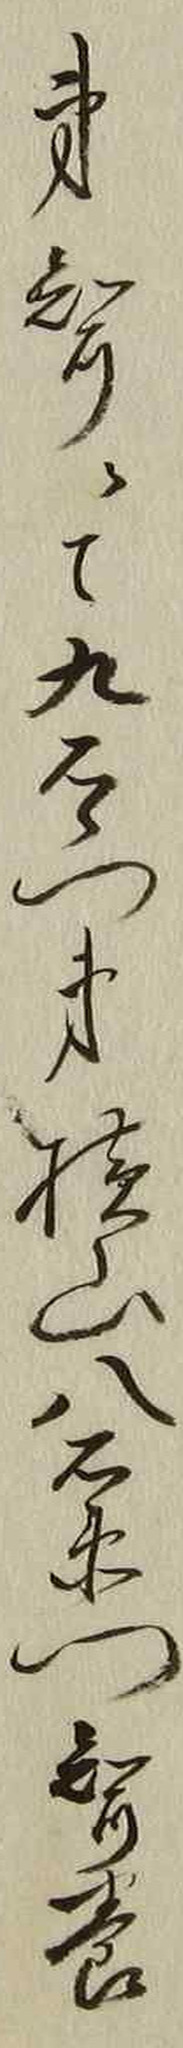弟婿ニて九右衛門弟横山八右衛門婿養
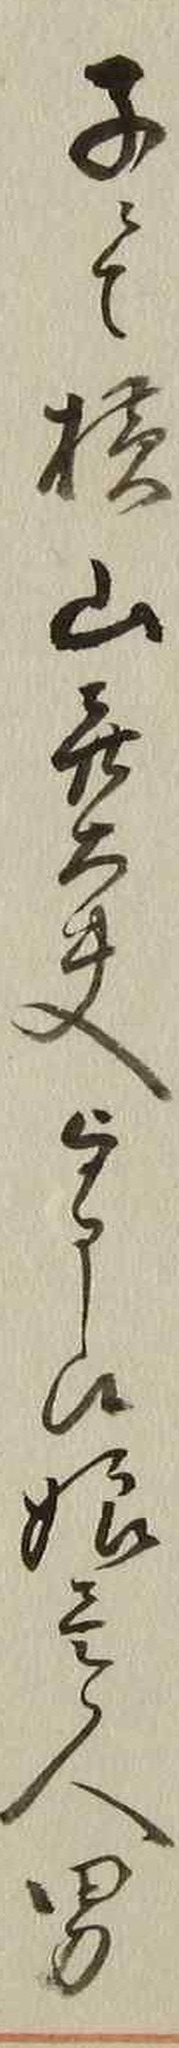子ニて横山喜大夫与申候娘壱人男
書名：諸士系譜　巻之122　よ之部5
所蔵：会津若松市立会津図書館
